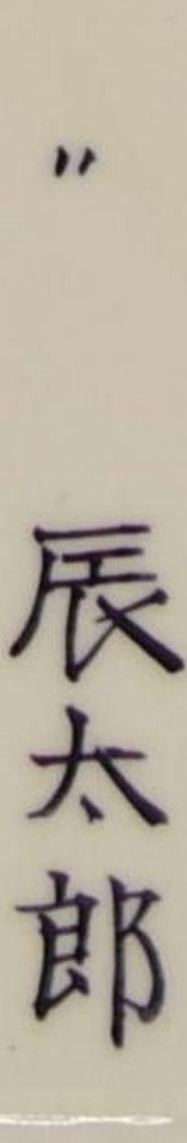辰太郎
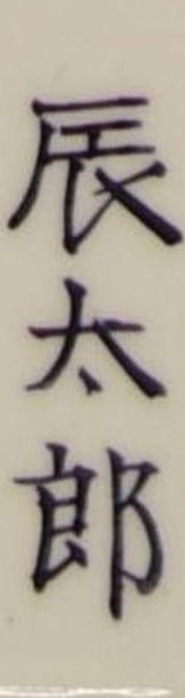辰太郎
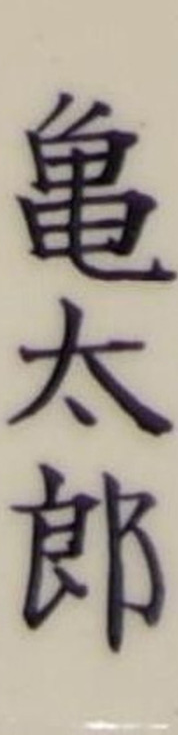亀太郎
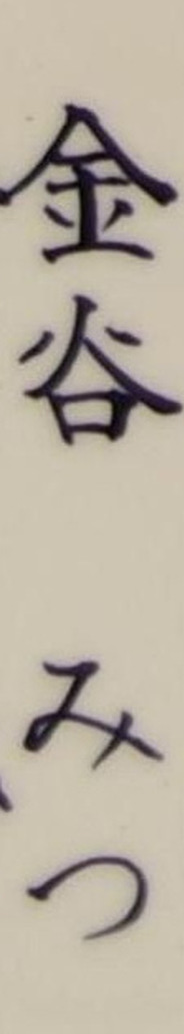金谷みつ
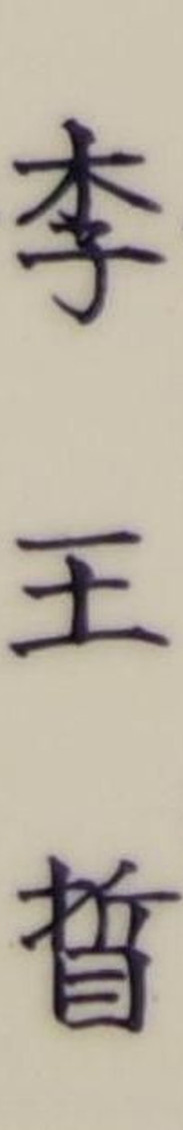李王䀸
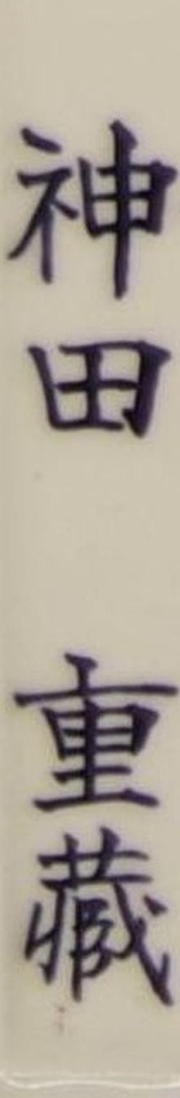神田重蔵

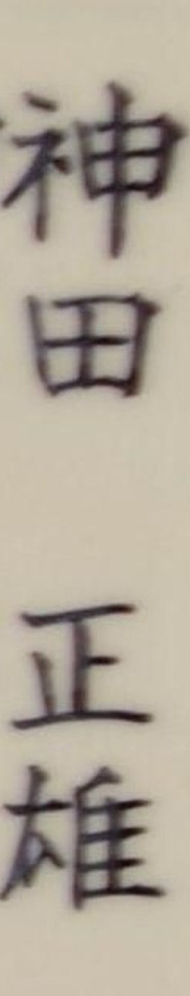神田正雄
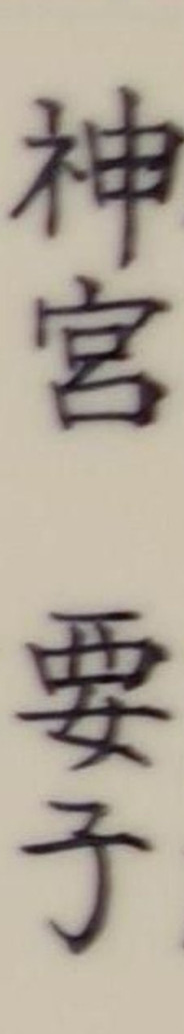神宮要子
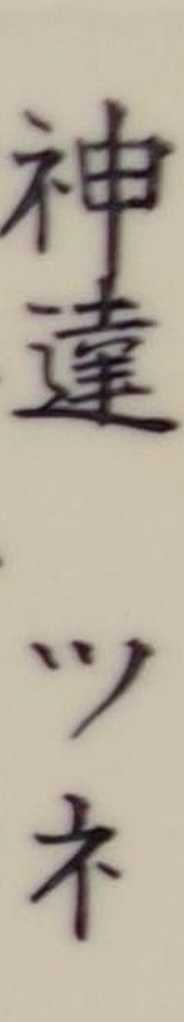神達ツネ
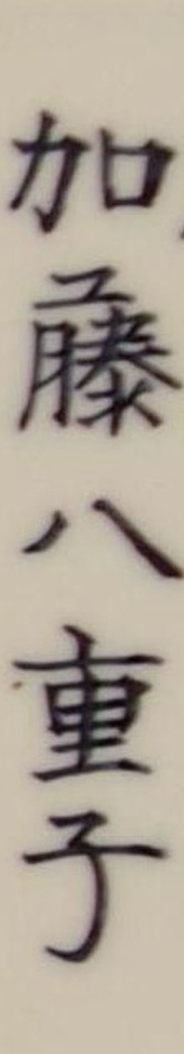加藤八重子
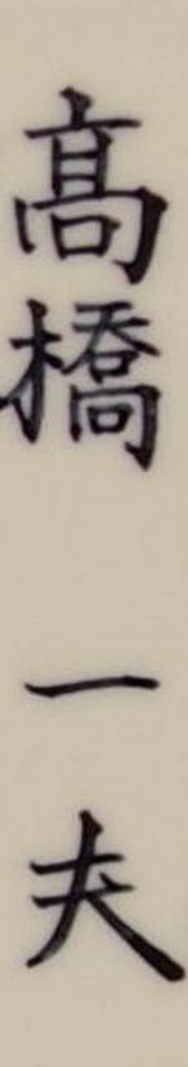高橋一夫
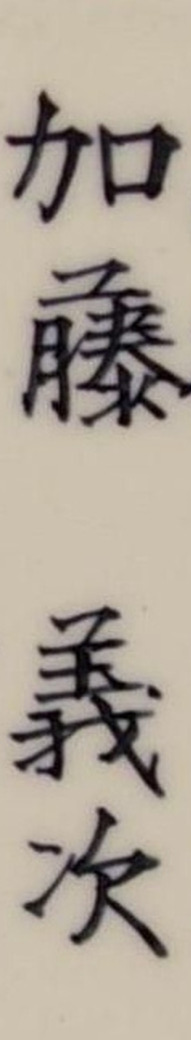加藤義次
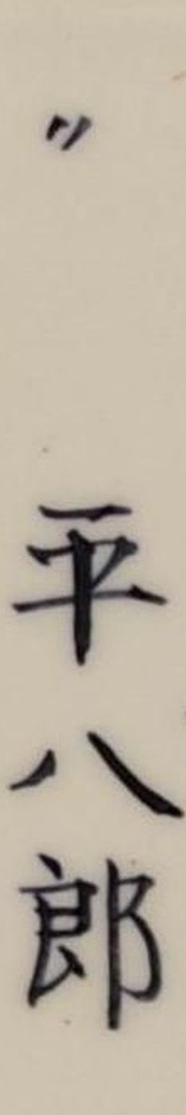平八郎
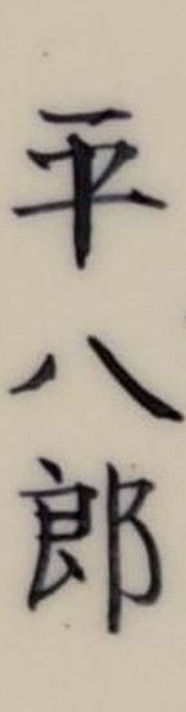平八郎
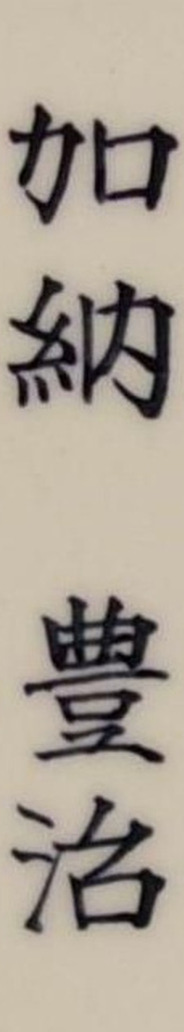加納豊治
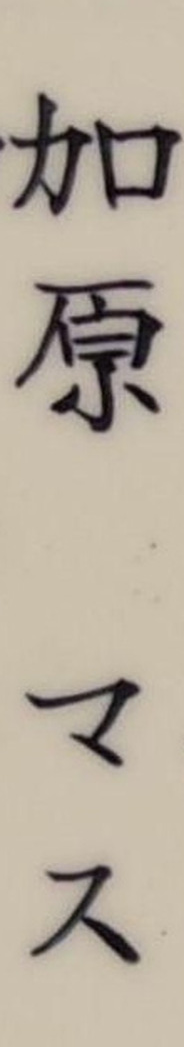加原マス
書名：E~L
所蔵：高野山金剛峯寺
